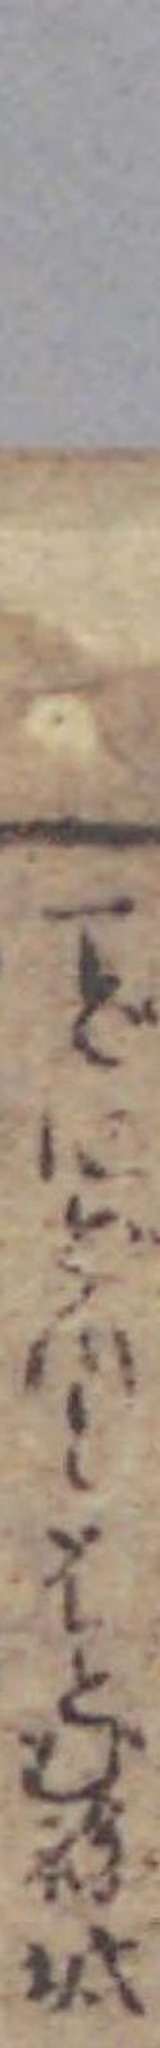一どにどつとはとむね城
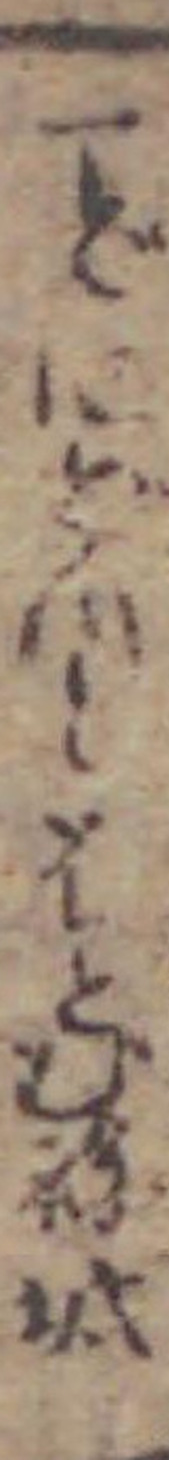一どにどつとはとむね城
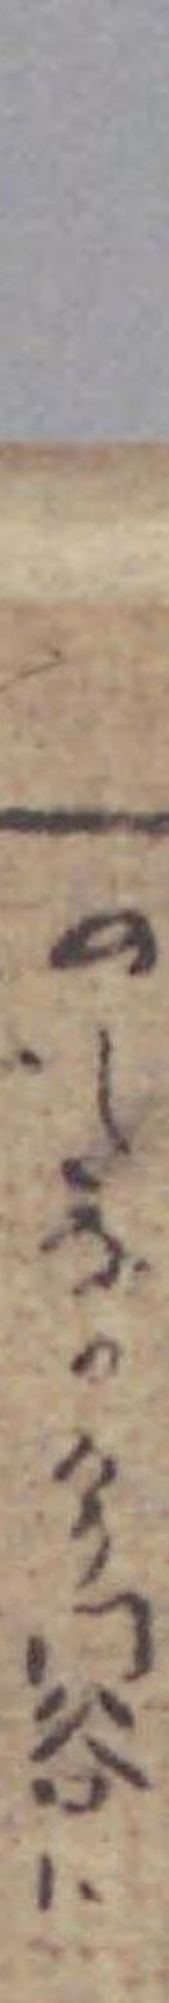のしたなるかう門谷に
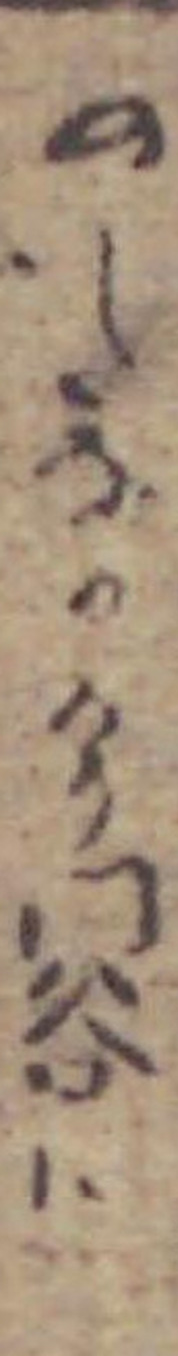のしたなるかう門谷に
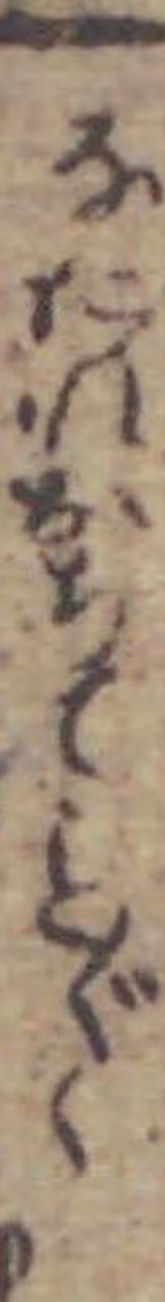なだれおちてこと〴〵く
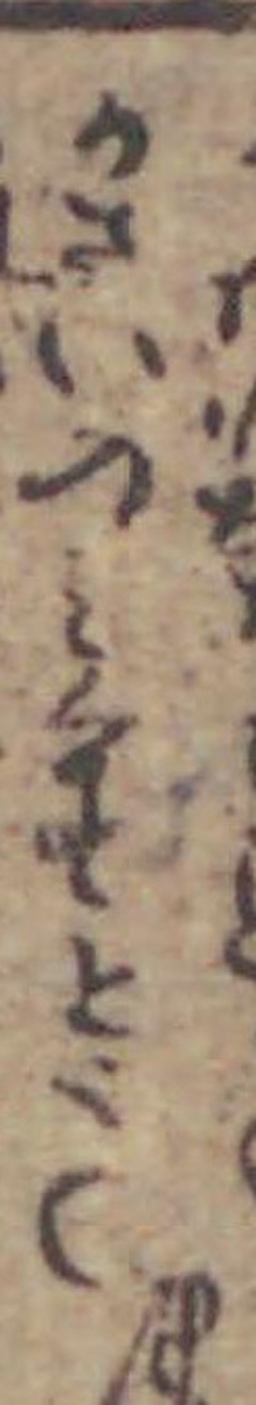かさいのもくすとて
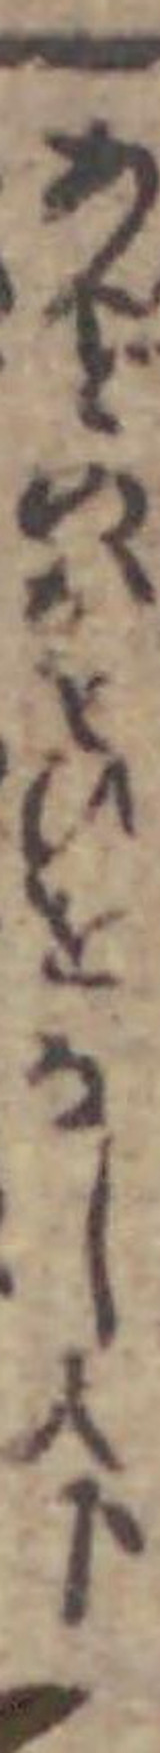あんどのおもひをなし天下
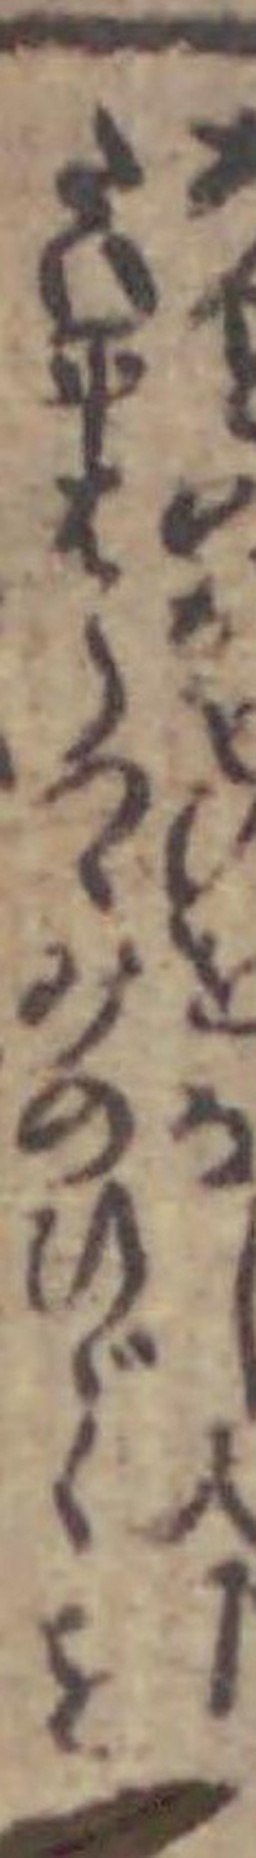たい平はらつゝみのひゞくを
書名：腹京師食物合戦 : 2巻
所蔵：国立国会図書館 National Diet Library, JAPAN
